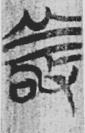敬
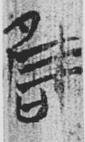唯
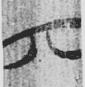亓（其）
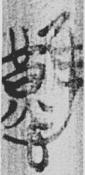戁（難）
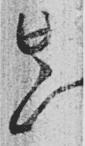也
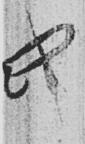女（汝）
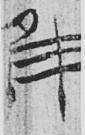隹（惟）
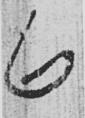㠯（以）
